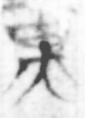黃
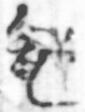○（豻）
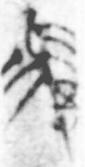馭（御）
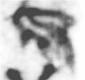君
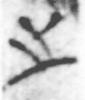之
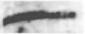一
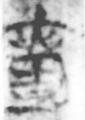𨍱（乘）
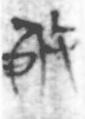○（畋）
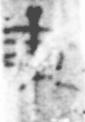車
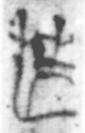苲
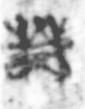兼
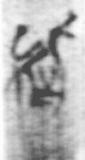紫
